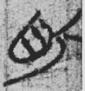艮
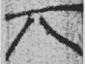亓（其）
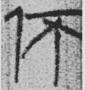伓（背）
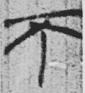不
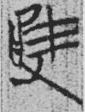○（獲）
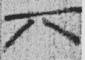亓（其）
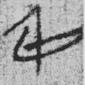身
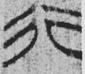行
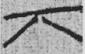亓（其）
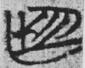廷
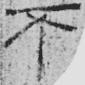不
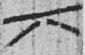亓（其）
